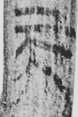而
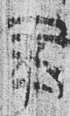不
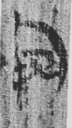○（窮）
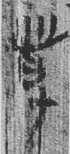○（一）
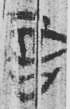言
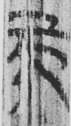而
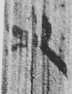又（有）
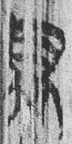衆
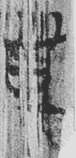○（一）
